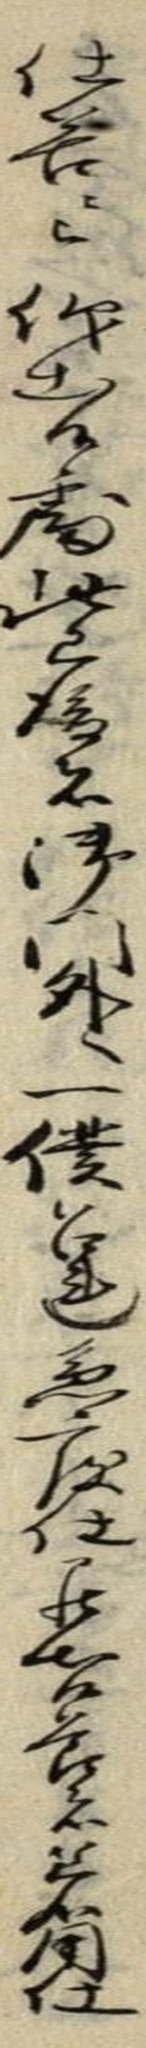仕筈に被仰出候処此已後は御門外へ一僕召連急度仕罷出候節は着用仕
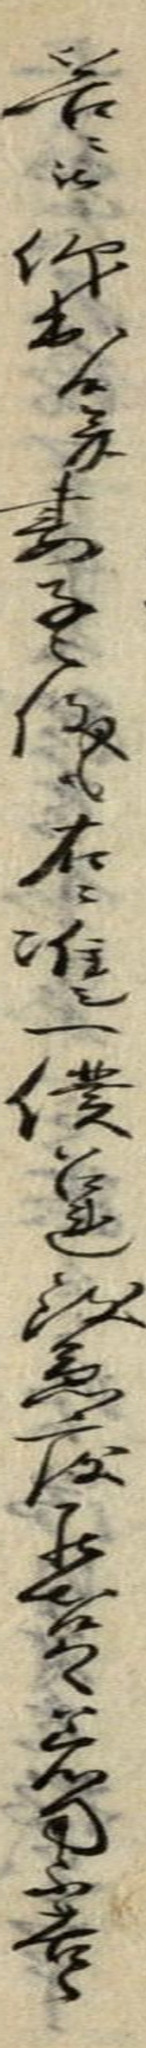筈に被仰出候幷妻子之儀も右に准し一僕召連致急度罷出候はゝ着用不苦候
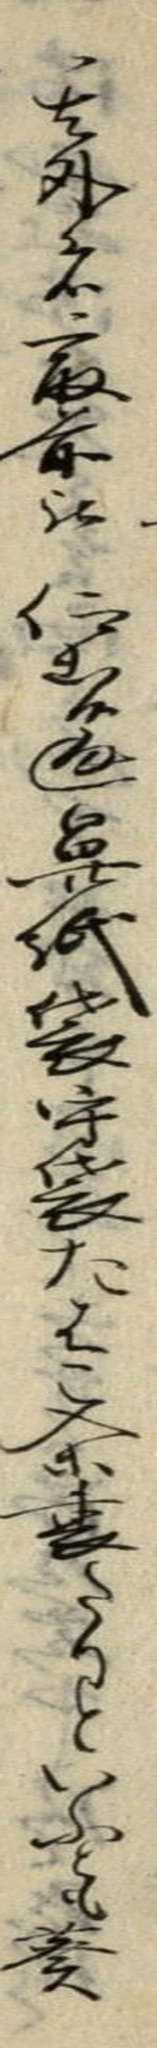其外は最前被仰出候通鼻紙袋守袋たはこ入等裏たりといふとも葵
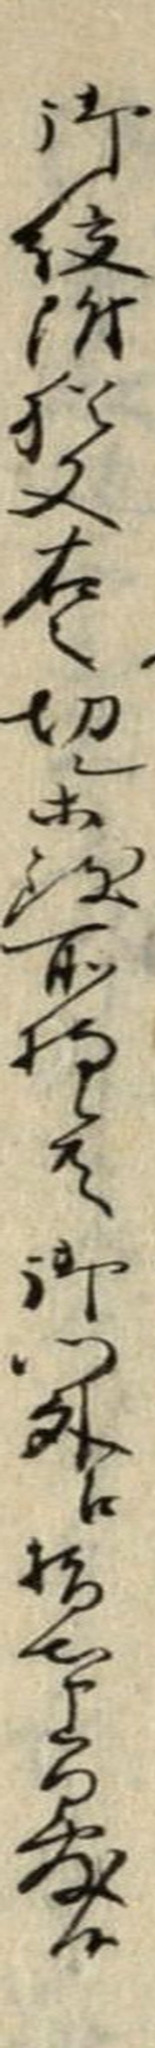御紋附猶又右之切れ等致所持候共御門外江指出申間敷候
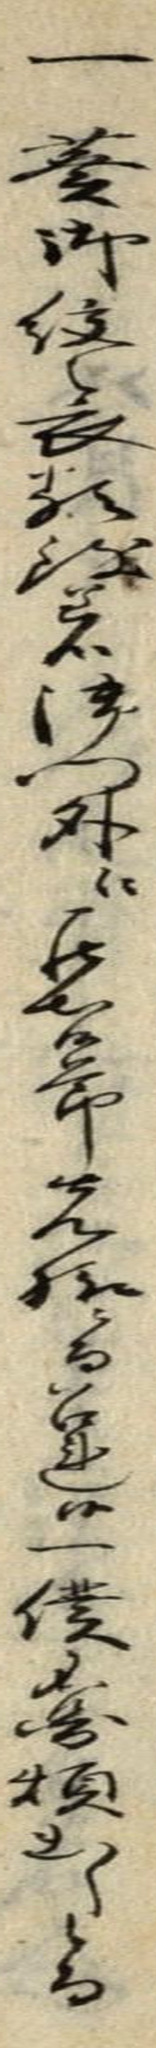一葵御紋之衣類致着御門外江罷出候節先様にて召連候一僕不図煩出し候て
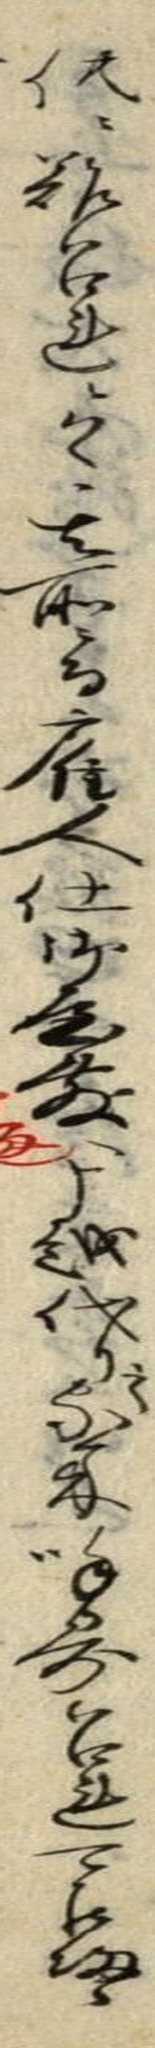供に難召連候はゝ其所にて雇人仕御屋敷へ申越代り之家来呼寄召連可罷帰候
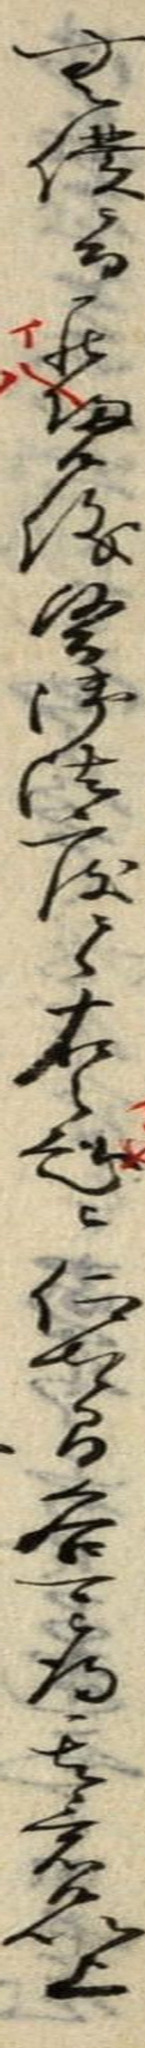無僕にて罷帰候儀堅御法度に候右之趣被仰出候間各可被得其意候以上
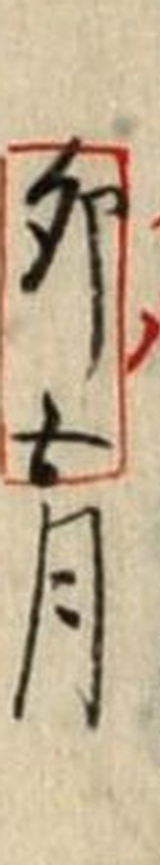卯五月
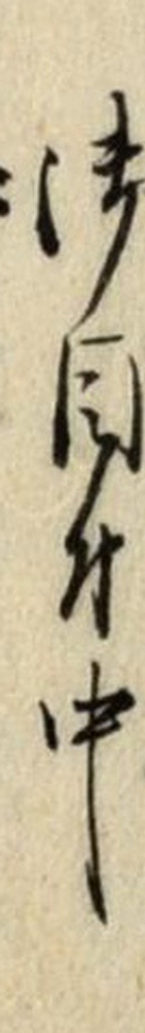御目付中

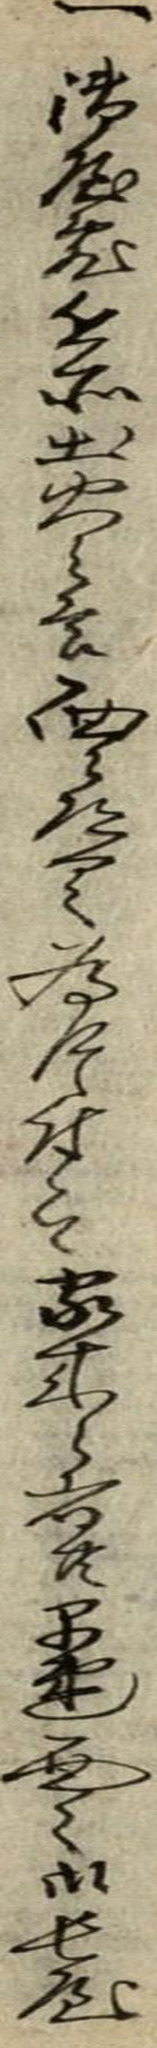イ△一御屋敷近所出火之節面々道具為片付候はゝ家来者共早速面々御長屋
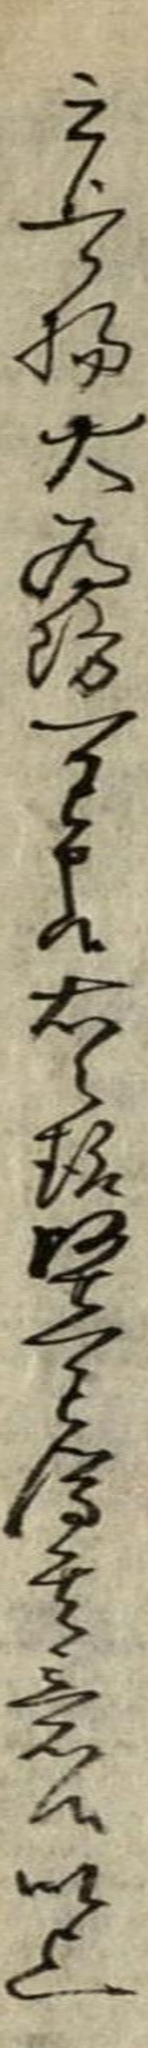之上へ揚火為防可被申候右之趣堅可被得其意候以上
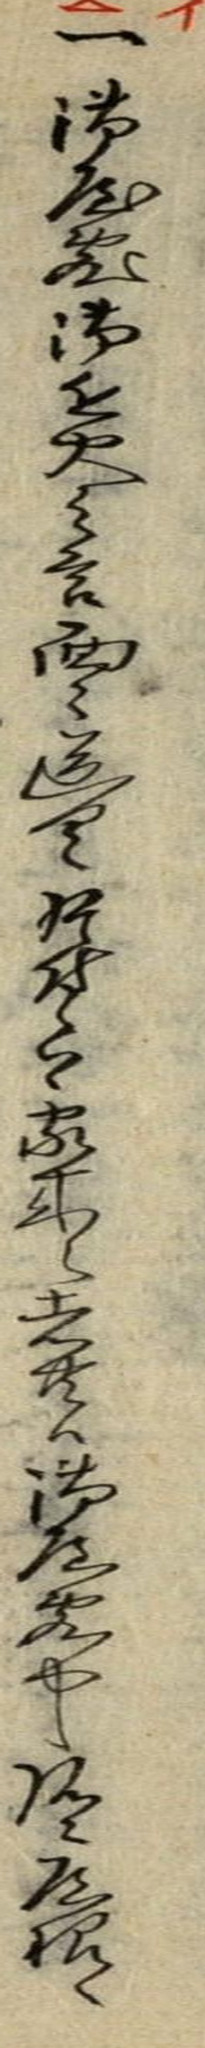イ△一御長屋御近火之節面々道具片付候はゝ家来之者共は御長屋中所々屋根へ
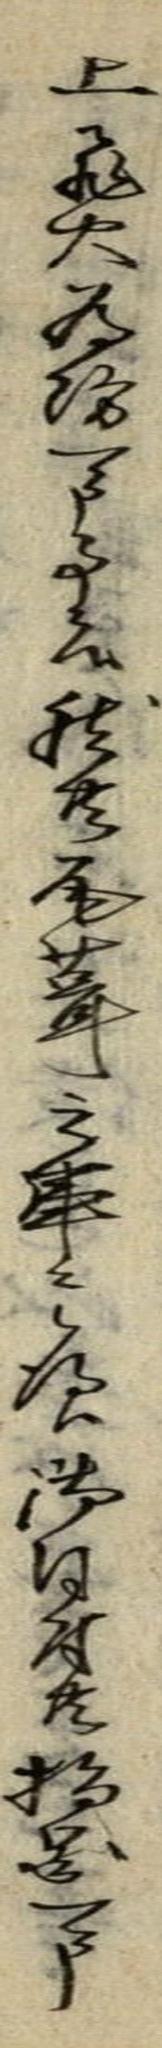上飛火為防可申事に候然共瓦葺之事に候得は御目付共指図可申
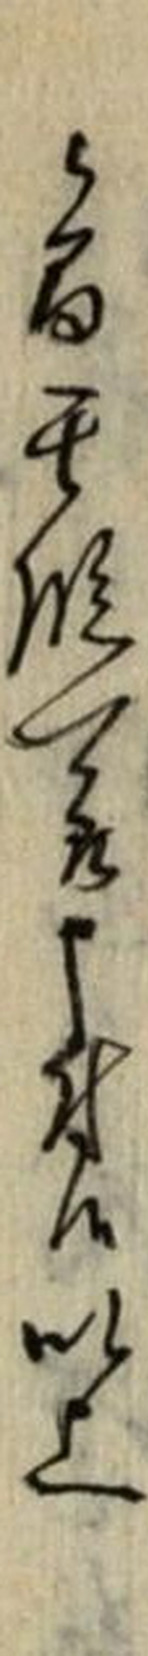候間其段可被申付候以上
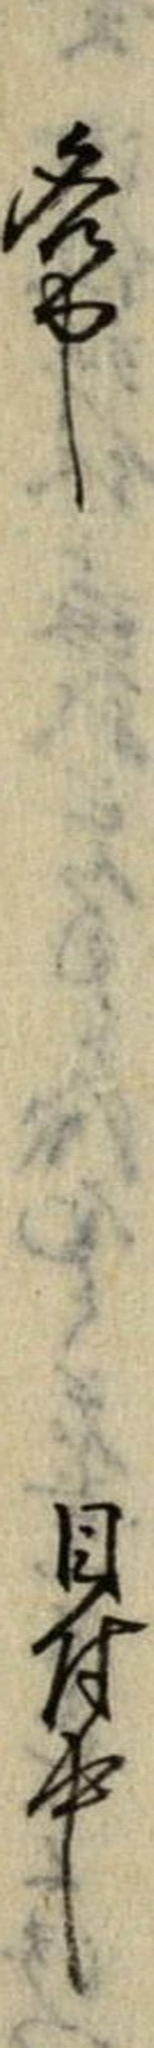各中目付中
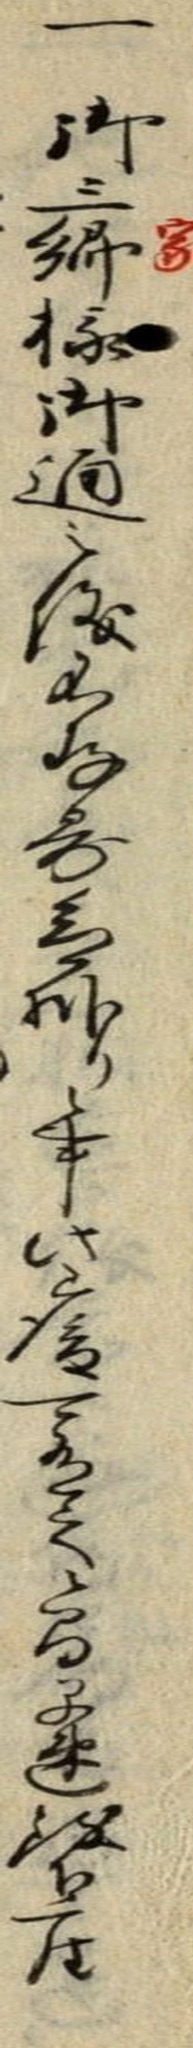一御三卿様御通之儀不存寄言掛り候事此已後可有之候間早速致下座
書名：三都并道中之部
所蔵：福井県文書館 Fukui Prefectural Archives
